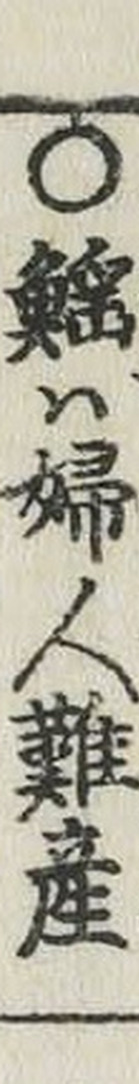○鰩は婦人難産
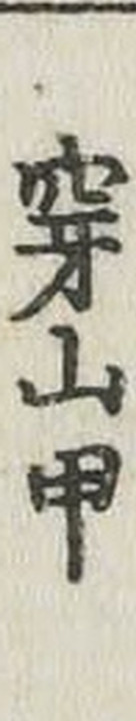穿山甲
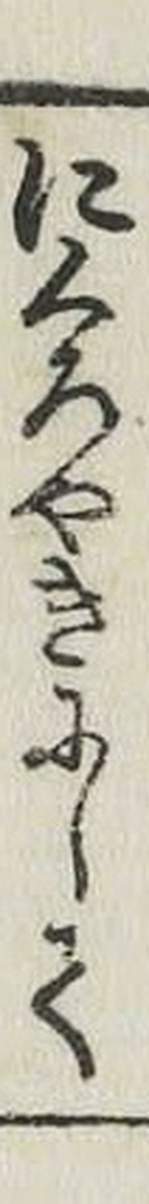にくろやきにして
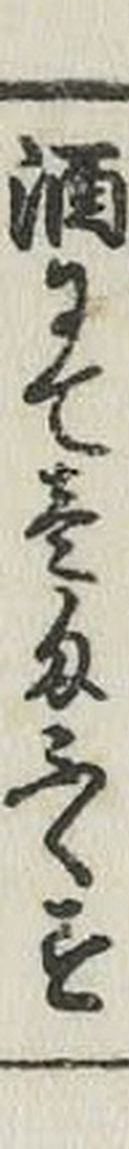酒にて壱匁ふくす
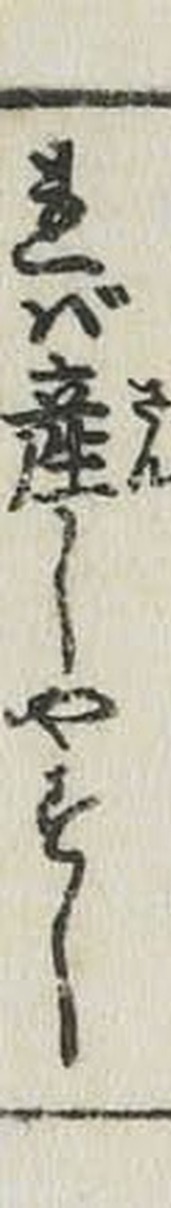れば産しやすし
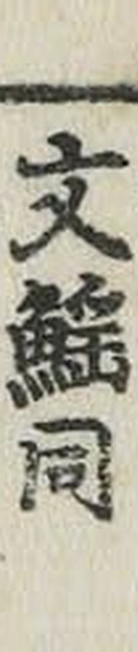文鰩同
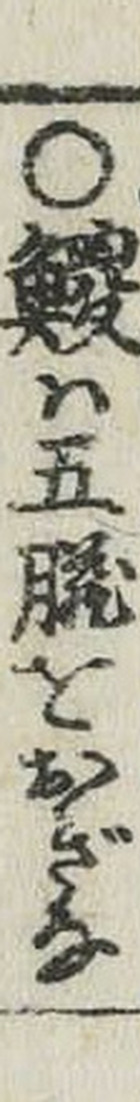○鯼は五臓をおぎな

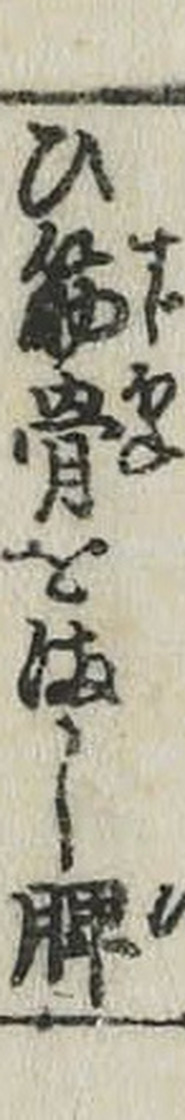ひ筋骨をまし脾
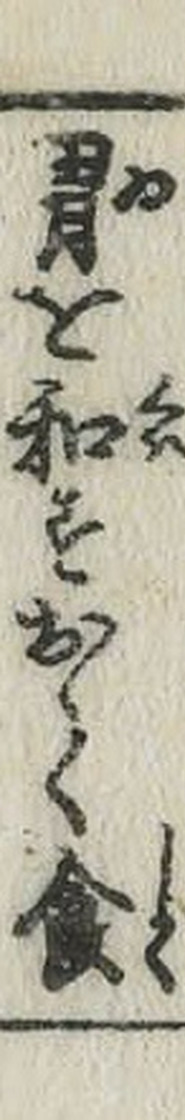胃を和すおゝく食
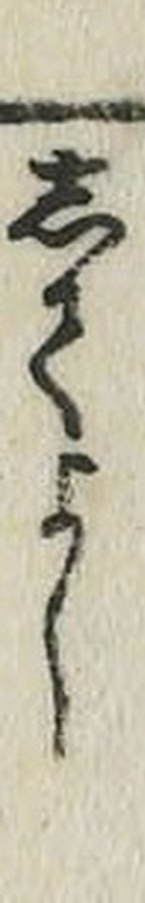してよし
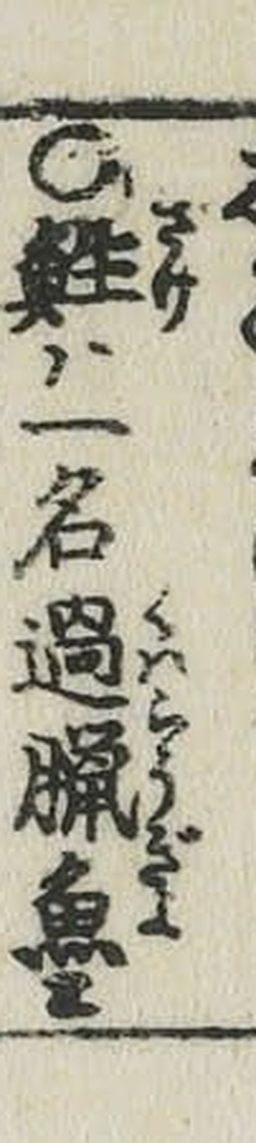○鮏は一名過臘魚と
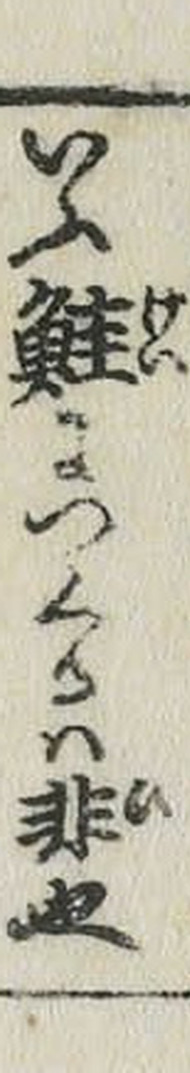いふ鮭につくるは非也
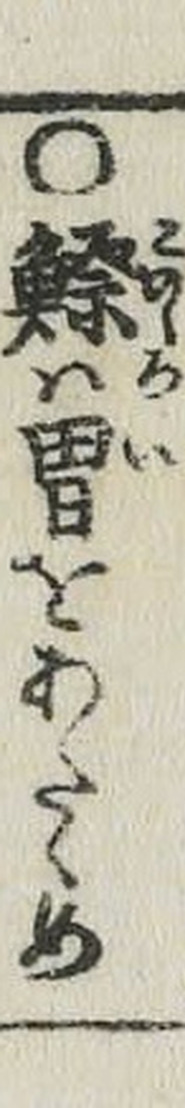○鰶はをあたゝめ
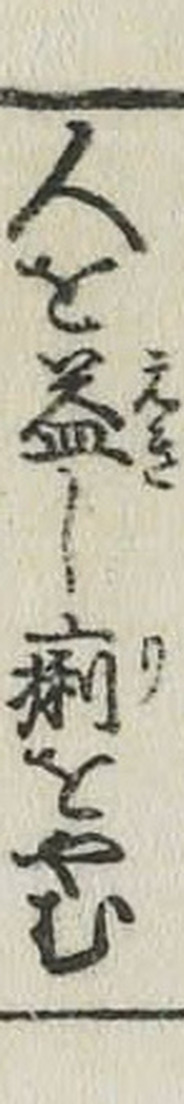人を益し痢をやむ
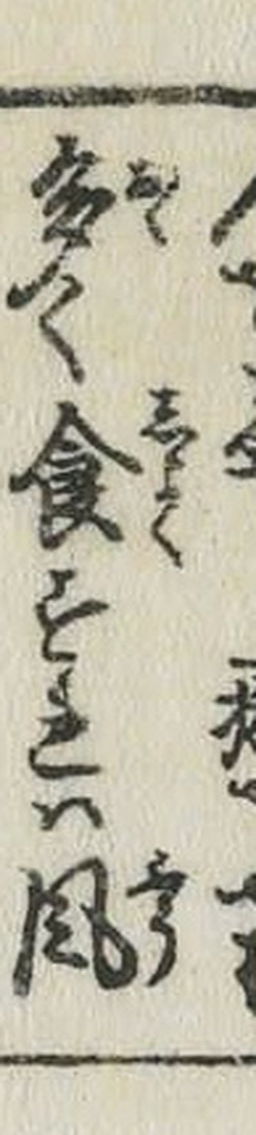多く食すれは風
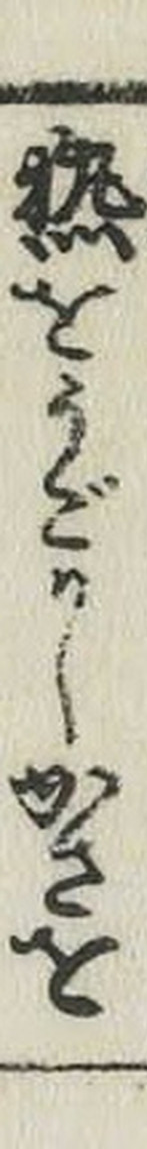熱をうごかしかさを
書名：増補頭書訓蒙図彙大成 10巻 7:巻之14-16
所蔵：東京学芸大学教育コンテンツアーカイブ
